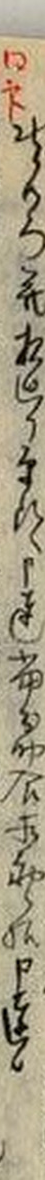次郎左衛門并夜廻り筆頭へ申達当分助合相勤候様申達候
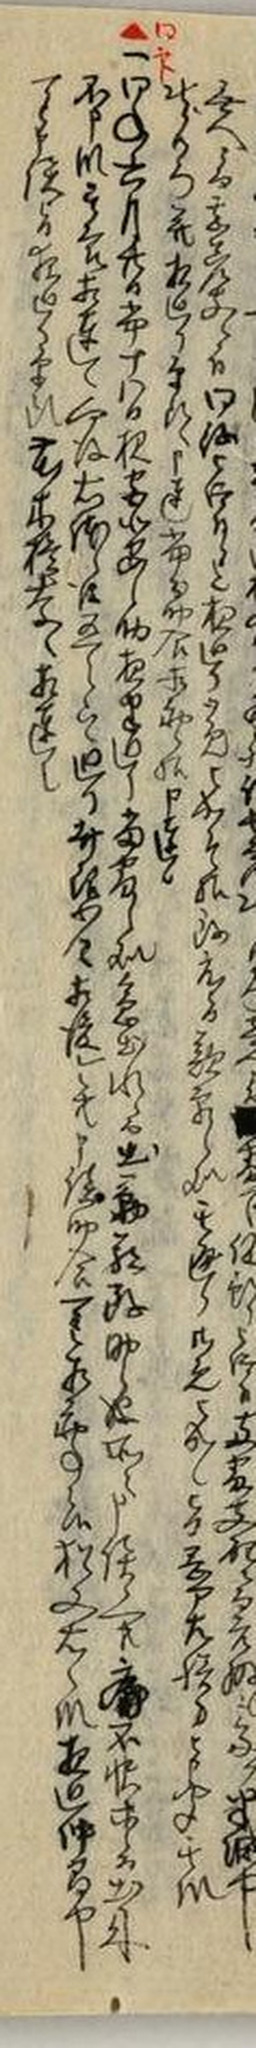一同年六月廿日当十八日夜宮北安之助夜半廻り当番之処急出水にて出勤難致助之儀所々申談候へ共病不快等にて出来
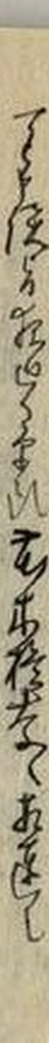可被申談旨夜廻り筆頭荒木権大夫へ相達之
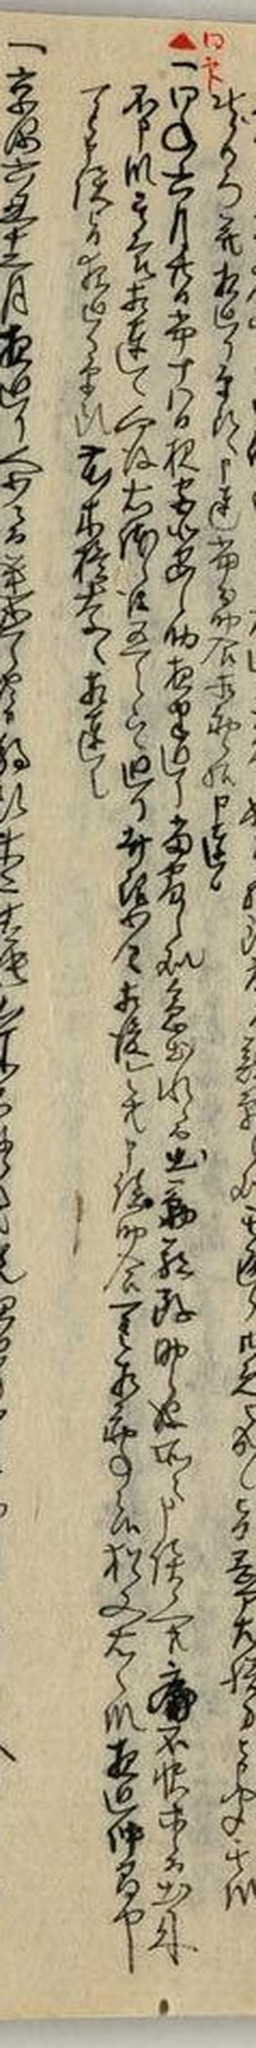不申段其節相達候向後右体之儀有之候はゝ廻り刻限少々相後レ候共申談助合可被相勤事に候猶又右之段夜廻仲間中
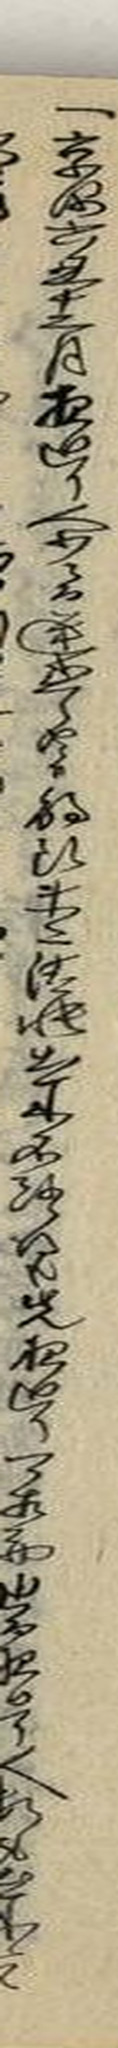一享保六丑十二月夜廻り人少にて迷惑之由に付触頭未た清帳出来不致候得共先夜廻り可相勤追て夜廻り人数も出来候はゝ
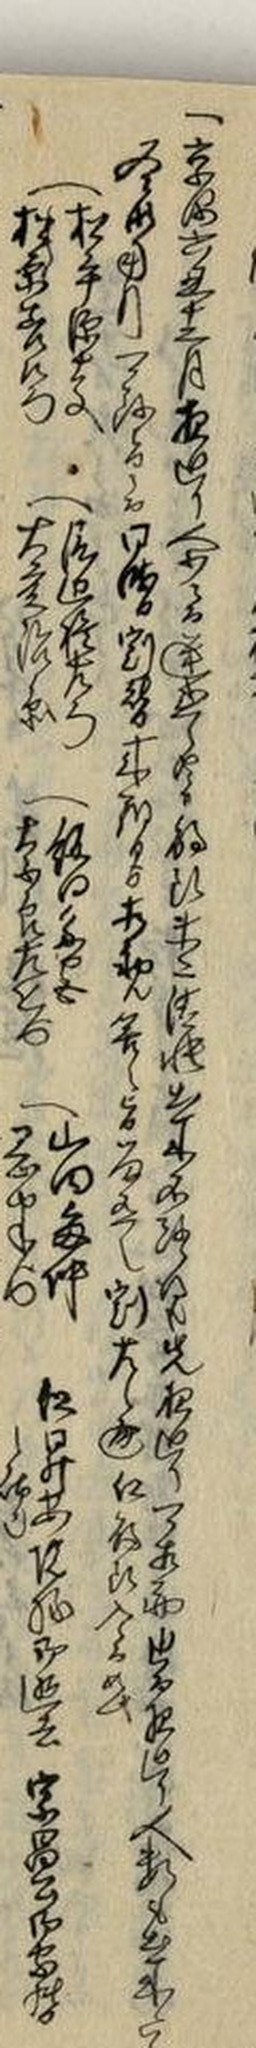又々御用引可致旨にて同晦日割替来朔日ゟ相勤ル筈之旨留有之割左之通但触頭入にて如此
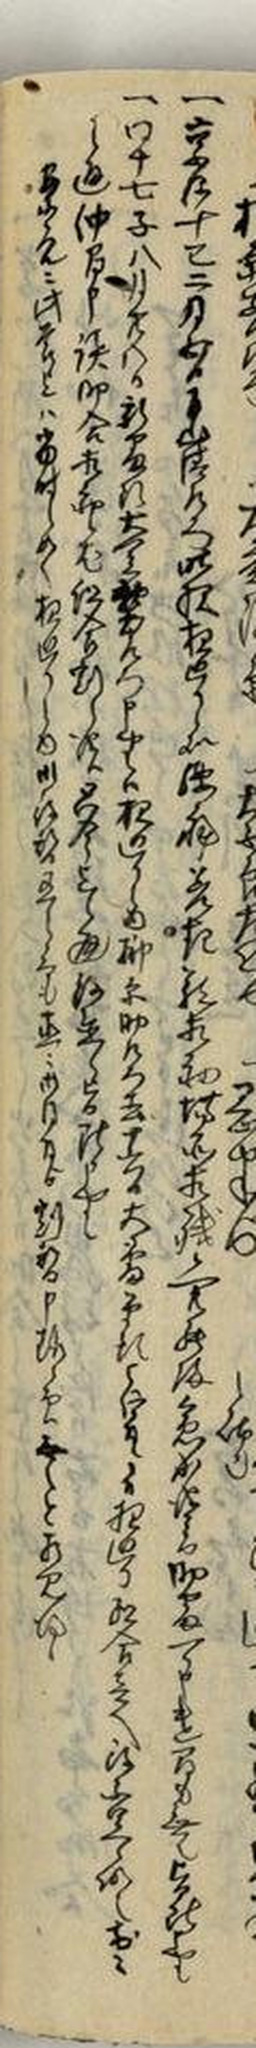一同十七子八月廿八日新番頭大関新五左衛門申聞候は夜廻り之内榊原助左衛門去十六日大番筆頭被仰付候に付夜廻り組合壱人致不足候仍之前々
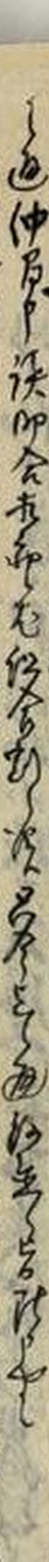之通仲間申談助合相勤候尤組合割之儀は只今迄之通致置候旨断申聞候
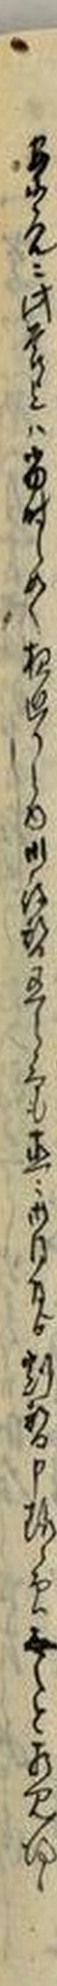案スルに此節迄は当時之如く夜廻り之内御役替有之候ても直に御目付ゟ割替申趣にては無之と相見得候
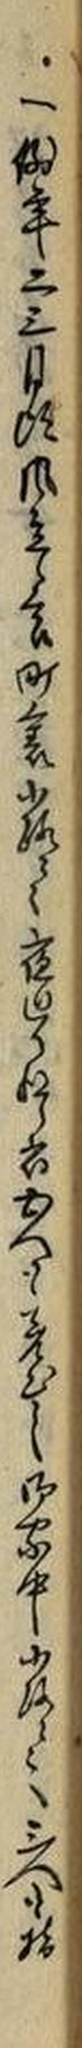一例年二三月頃風立候節町裏小路々々夜廻り組之者五人ツヽ差出之御家中小路々々へ三人ツヽ指
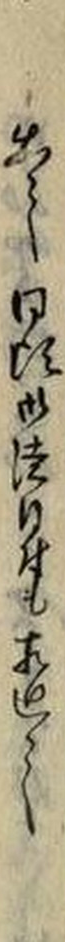出之同頃御徒目付も相廻之
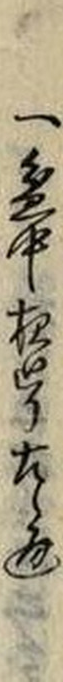一盆中夜廻り左之通
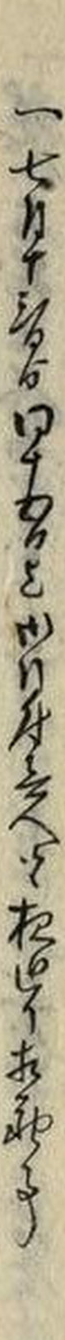一七月十三日ゟ同十五日迄御目付壱人ツヽ夜廻り相勤候事
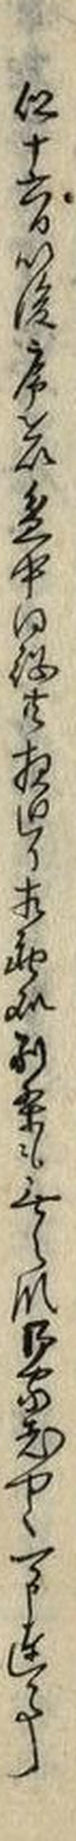但十六日以後序を以盆中同役共夜廻り相勤候処別条も無之段御家老中へ可申達事
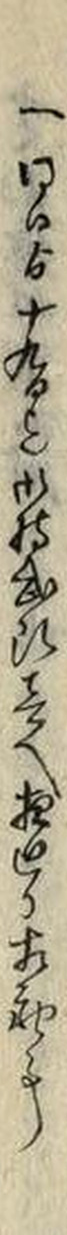一同日ゟ十九日迄御持武頭壱人夜廻り相勤候事
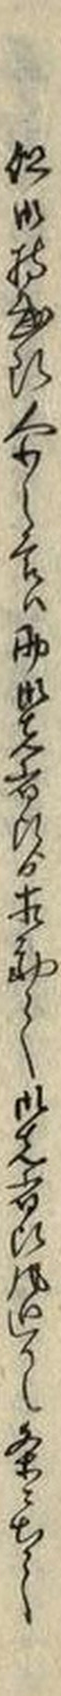但御持武頭人少之節は助御先者頭ゟ相勤之御先者頭風廻り之条に出之
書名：御城下諸事之部
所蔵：福井県文書館 Fukui Prefectural Archives
